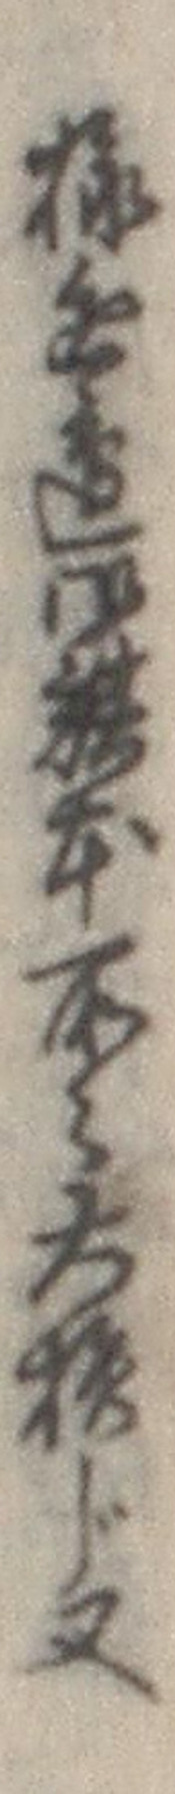様近邊御旗本所〻大損じ又
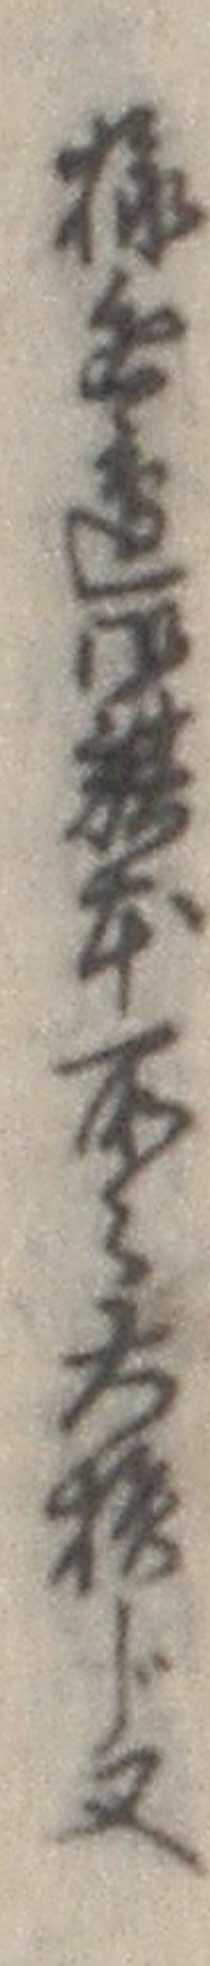様近邊御旗本所〻大損じ又
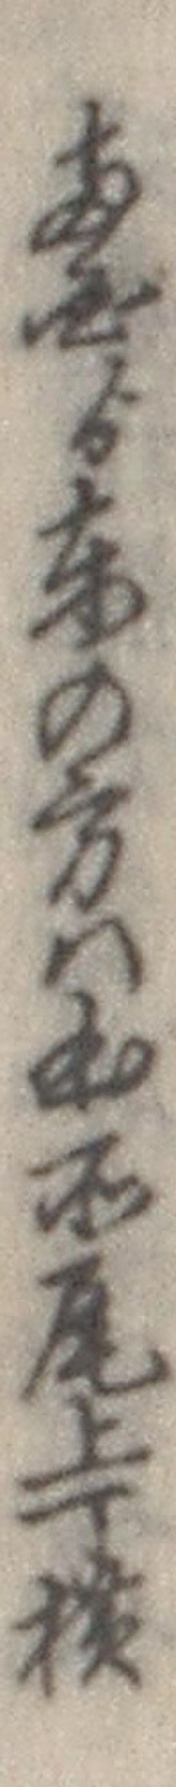両国ゟ東の方は出所尾上丁横
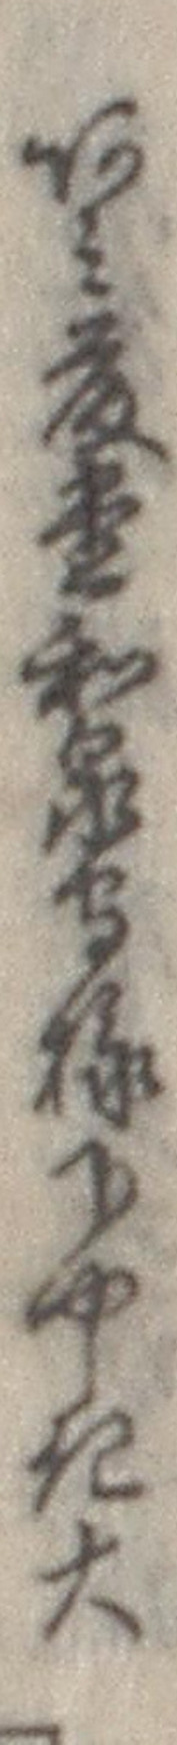あわ藤堂和泉守様下やしき大
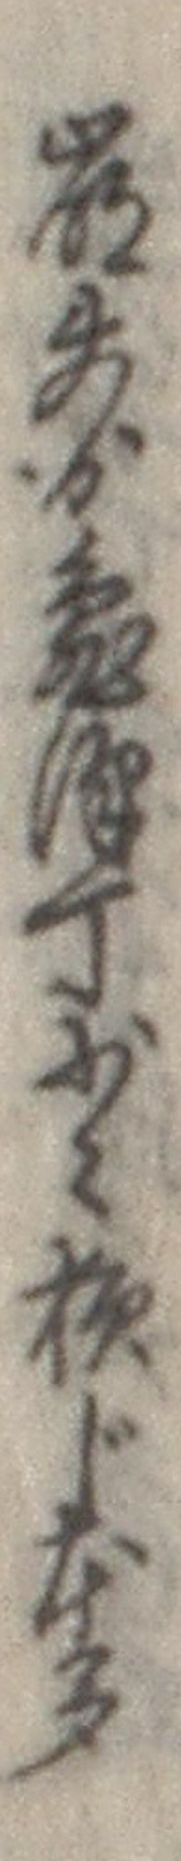崩夫ゟ亀澤丁少〻損じ本多
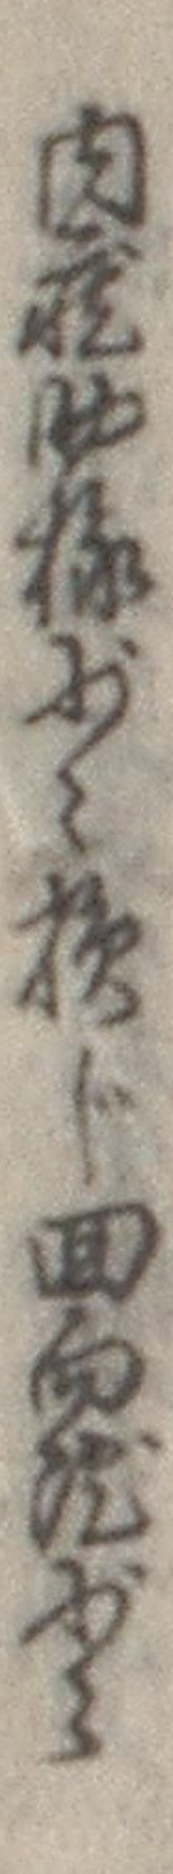内蔵助様少〻損じ回向院少〻
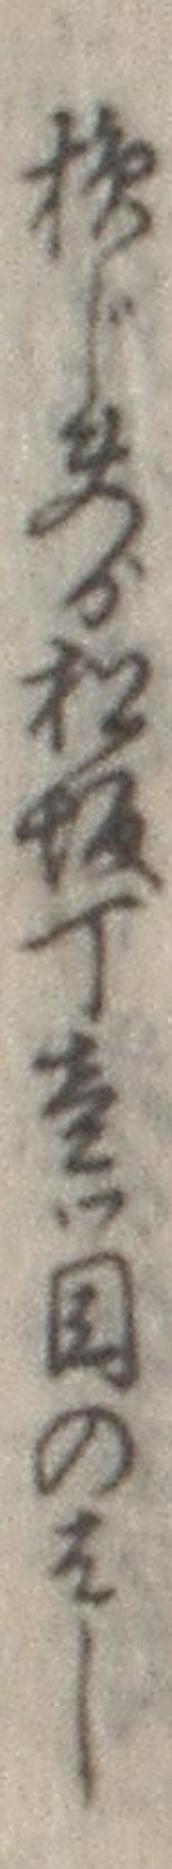損じ夫ゟ松坂丁壱ツ目のはし
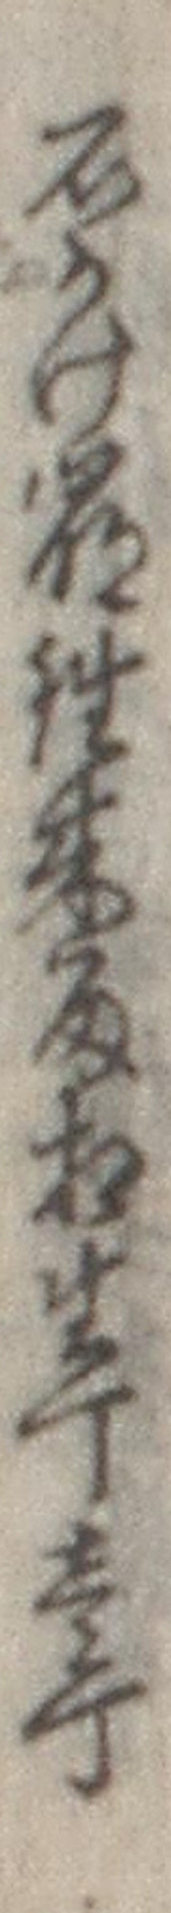石かけ崩往来留相生丁壱丁
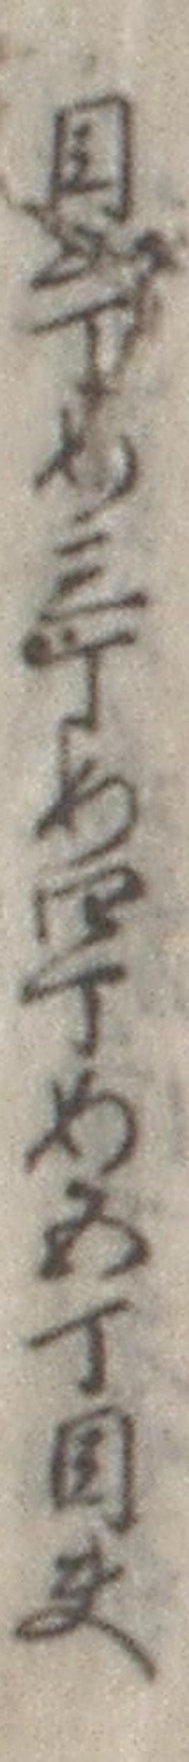目二丁め三丁め四丁め五丁目夫
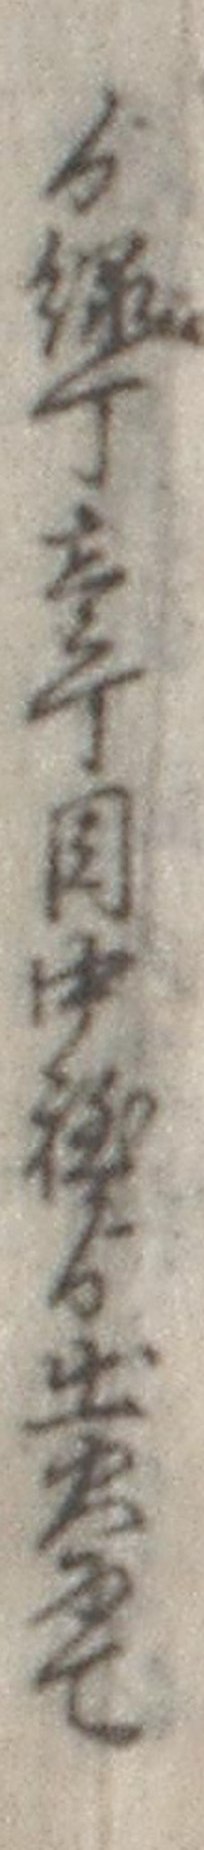ゟ緑丁壱丁目中程より出火にて
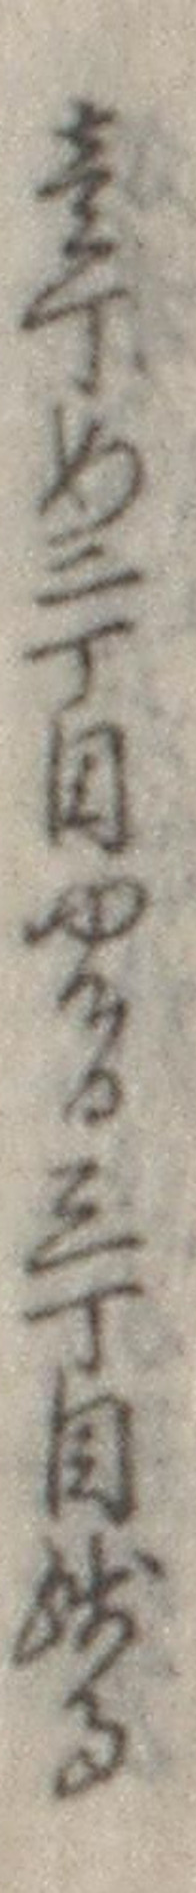壱丁め二丁目やける三丁目残る
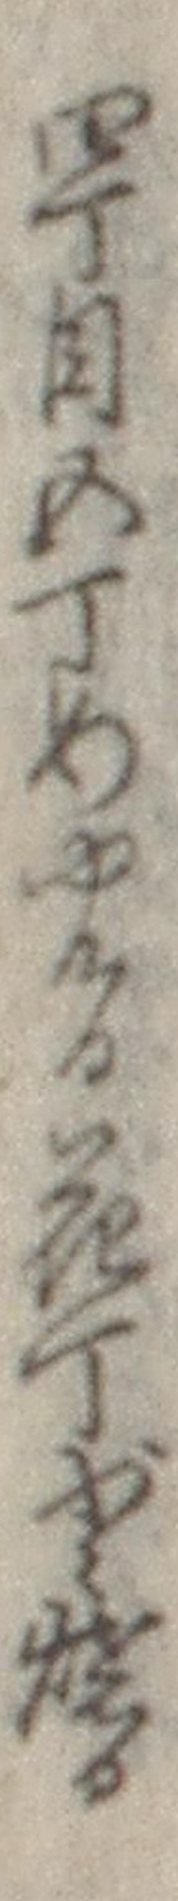四丁目五丁めやける花丁少〻焼る
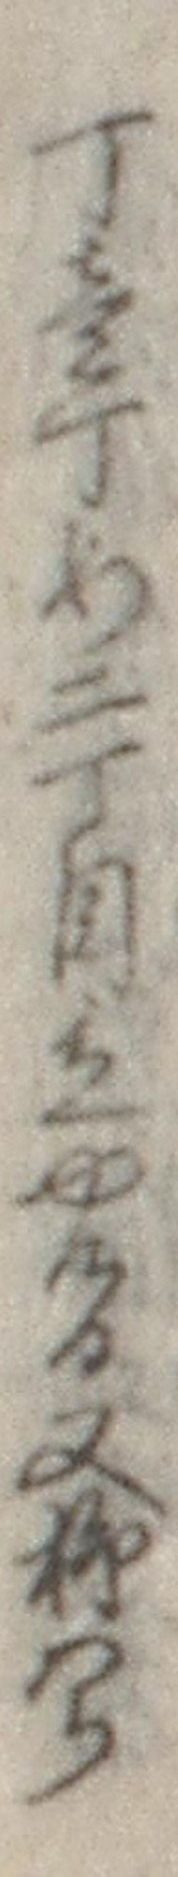丁壱丁め二丁目迄やける又柳はら
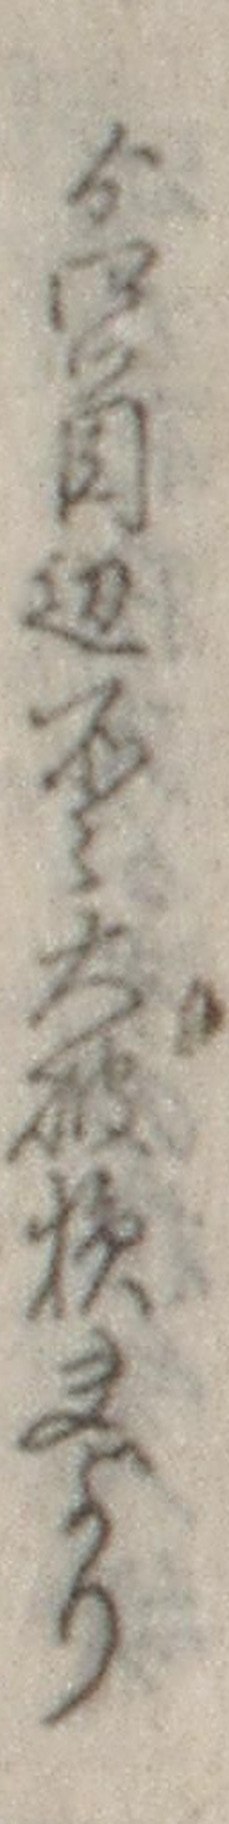ゟ四ツ目辺所〻大破損夫より
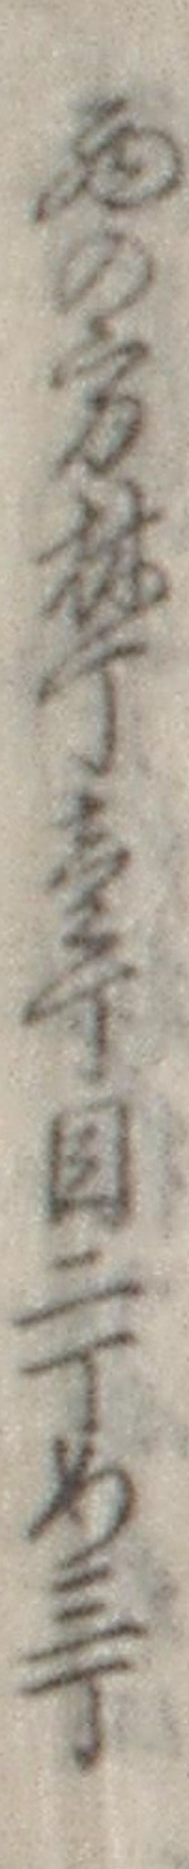西の方林丁壱丁目二丁め三丁
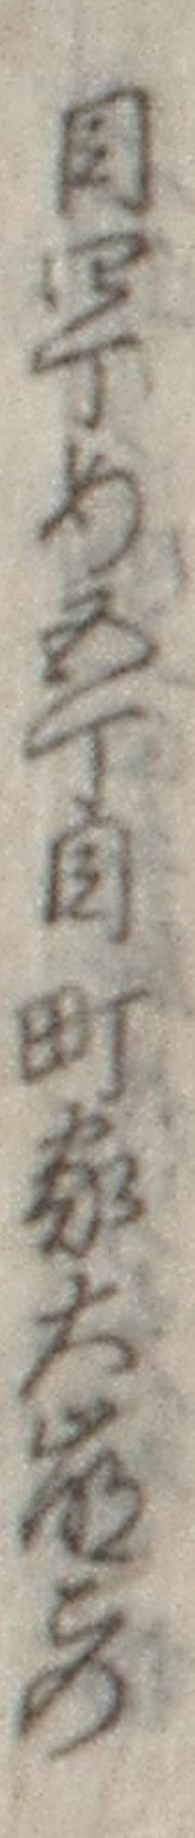目四丁め五丁目町家大崩この
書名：江戸　大地震臣細録　全
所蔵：東京大学地震研究所図書室 Earthquake Research Institute Library, The University of Tokyo, JAPAN
